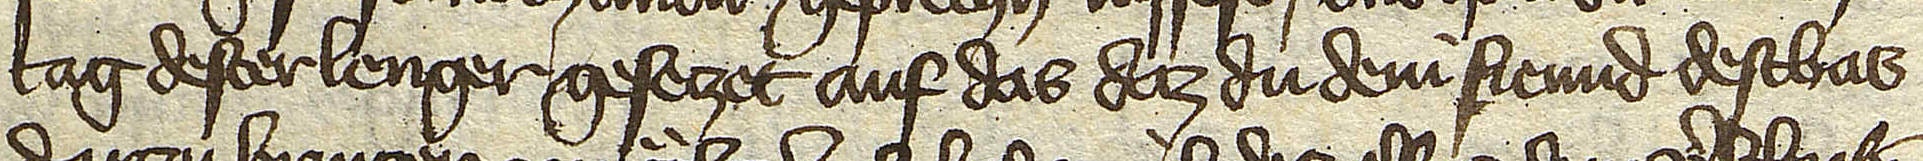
tag deſter lenger geſecʒet auf das daʒ du dein freund deſtbas
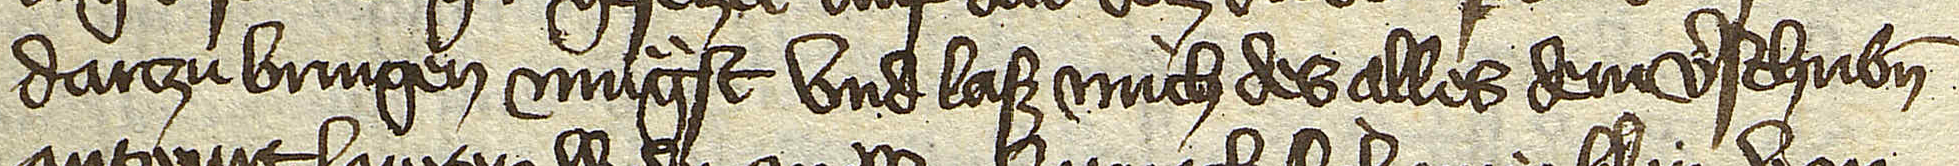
darcʒu bringen mügſt vnd laſʒ mich des alles dem v*ſchribn*
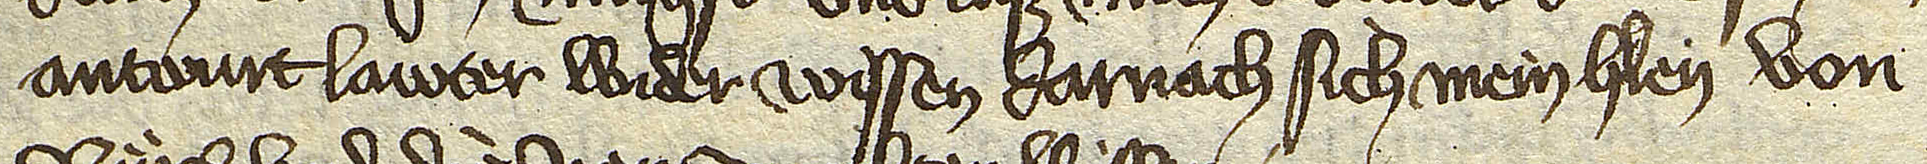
antwurt lawter wider wiſſen darnach ſich mein h*ren von
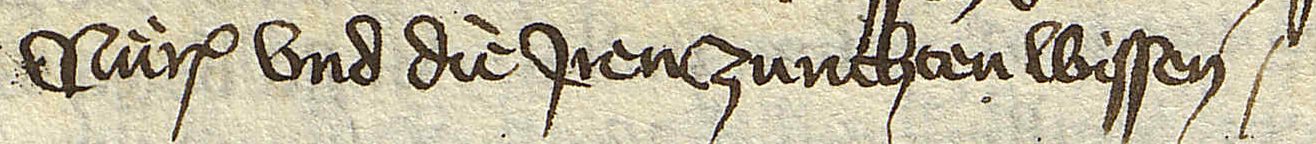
Nür* vnd die Iren cʒu richten wiſſen /
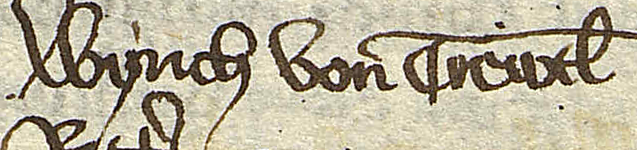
Wyrich von Trewtl*
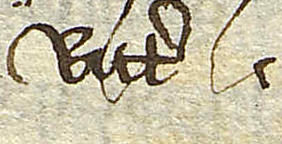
Ritt* .
